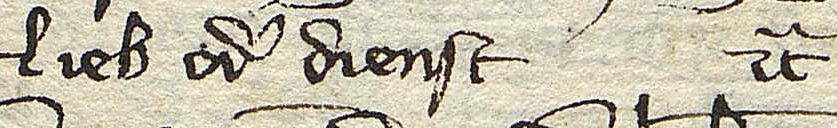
lieb od* dienſt ec*
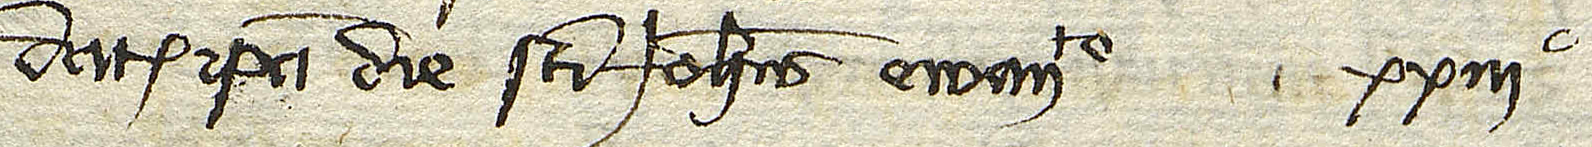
Dat* ipa* die ſci* Ioh*is ewan* xxiii*
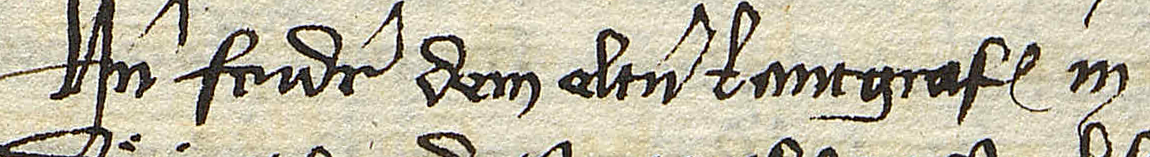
Hn* fridr* dem elt*n lantgraf* in
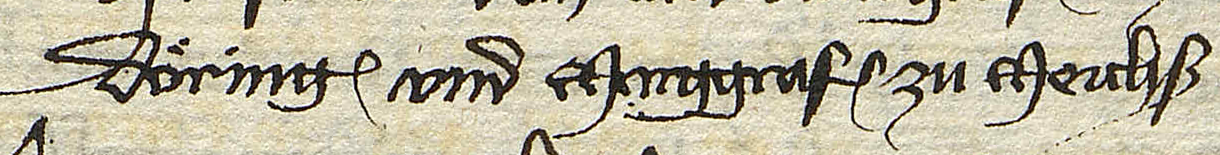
Döring* vnd Marggraf* ʒu Meichſ*
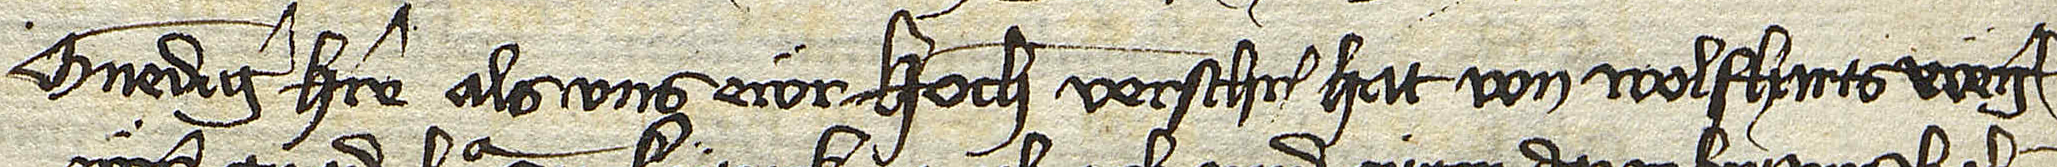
Gnedig* h*re als vns eẅr Hoch* verſchr* hat von wolfharts weg*
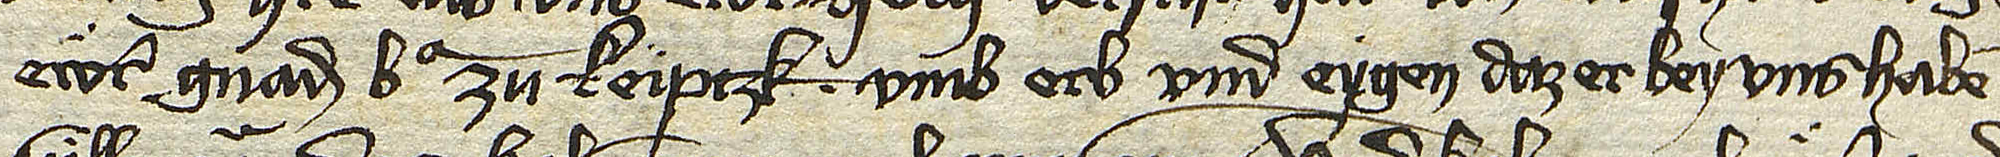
eẅr* gnad* b* ʒu leipcʒk . vmb erb vnd eygen daʒ er bey vns habe*
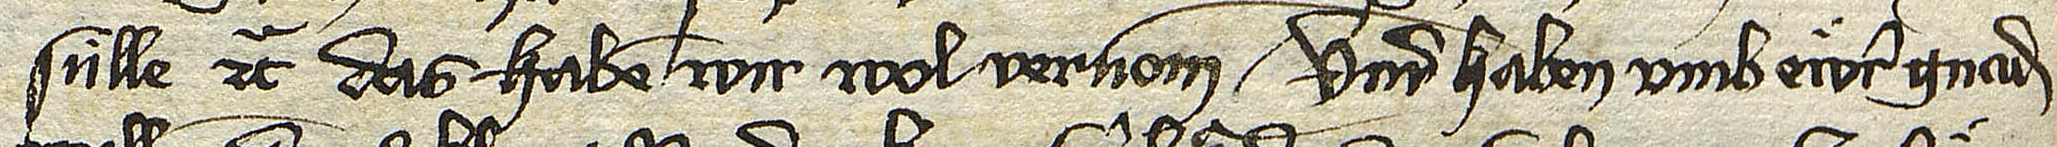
ſülle ec* das habe* wir wol vernom* / Vnd haben vmb eẅr* gnad*
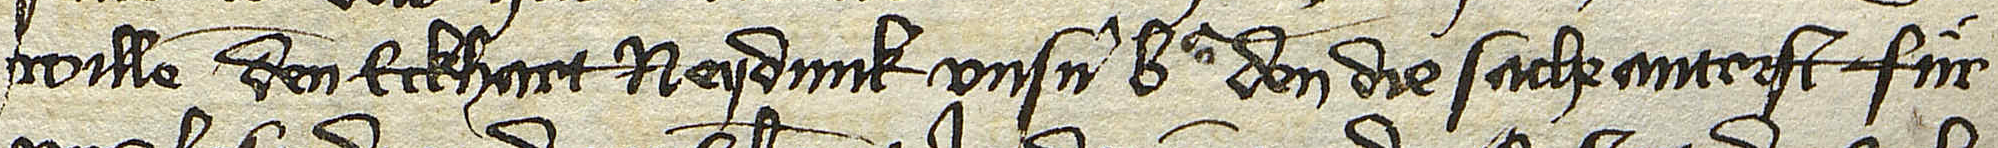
wille* den Eckhart Neydunk vnſ*n b* den die ſache antrift für
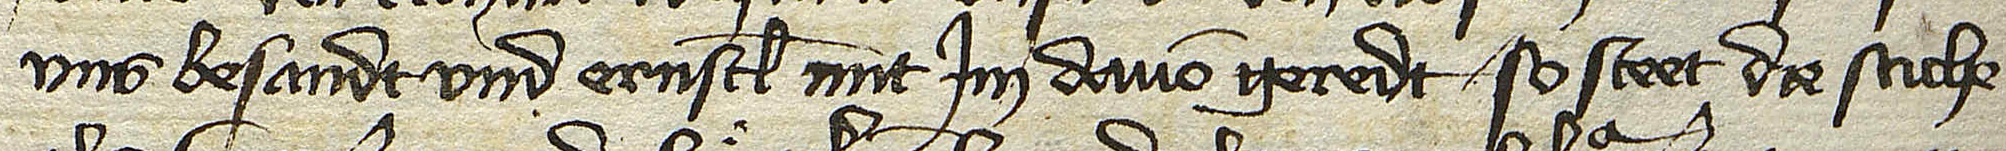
vns beſandt vnd ernſtl* mit Im dauo* geredt / ſo ſteet die ſache
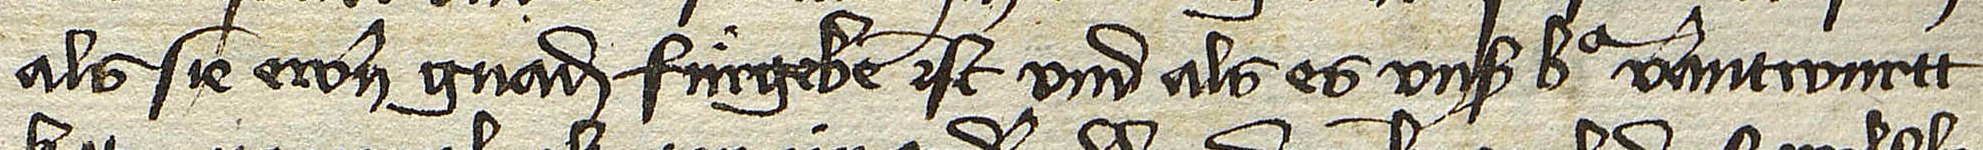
als ſie ew*n gnad fürgebe* iſt vnd als es vnſ* b* v*antwurtt
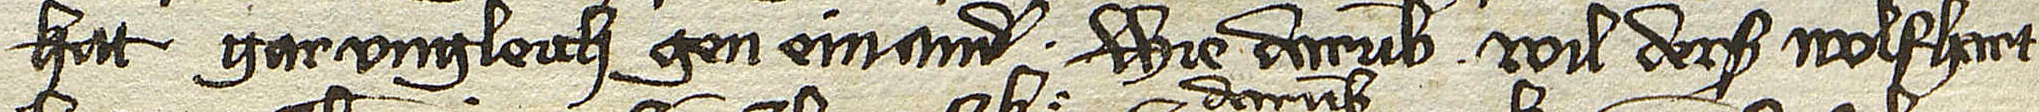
hat gar vngleich gen einand* . Wie darüb* . wil derſ* wolfhart
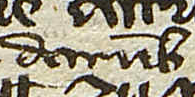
darub*
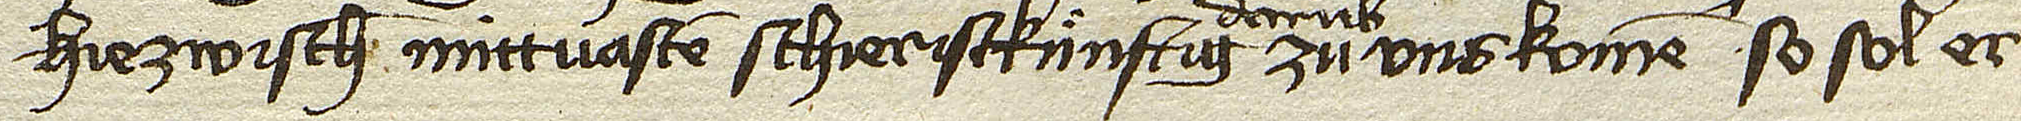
hieʒwiſch* mittuaſte* ſchieriſtkünſtig* ʒu vns kome* . ſo ſol er
